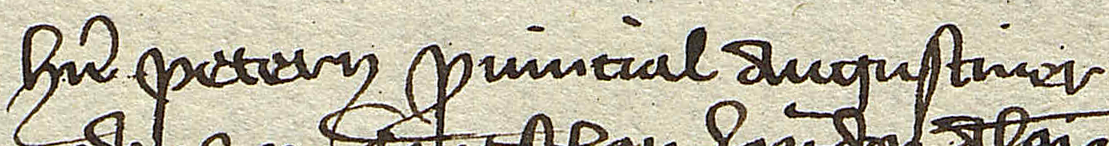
hn* petern p*unicial Auguſtiner
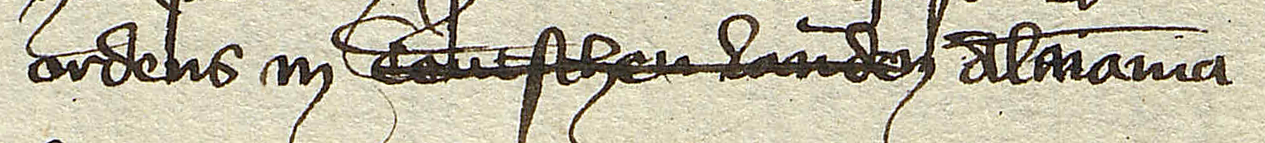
ordens in Teutſchen landen Almania*
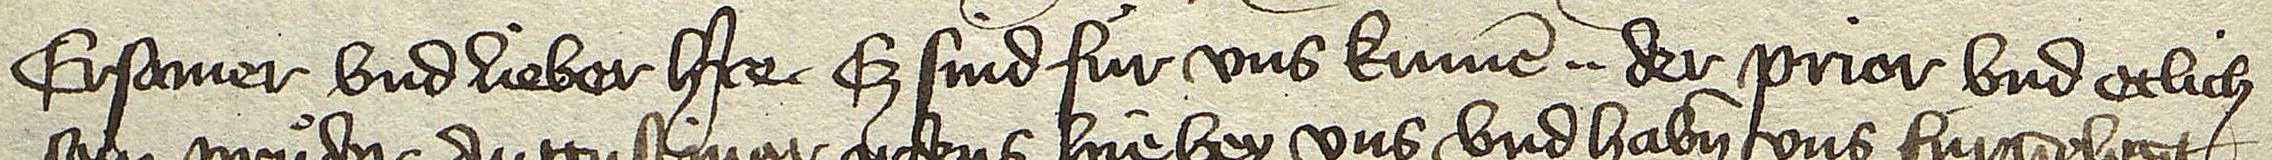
Erſamer vnd lieber h*re / Eʒ ſind für vns kume* ~ der prior vnd etlich
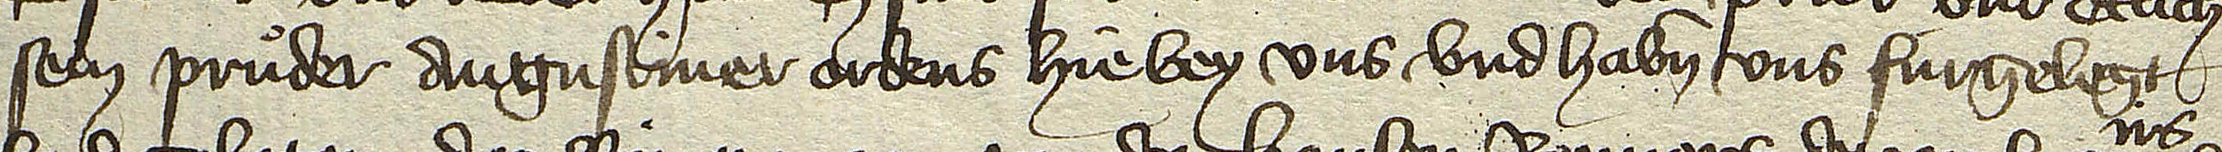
ſein prüder Auguſtiner ordens hie bey vns / vnd habn* vns fürgelegt
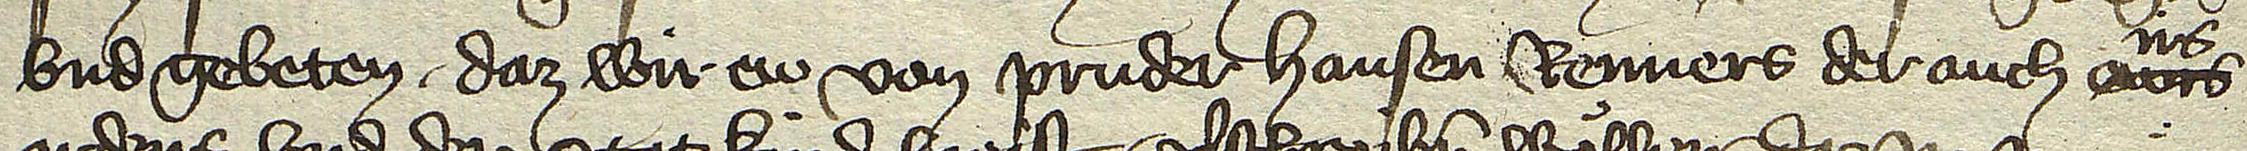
vnd gebeten / daʒ wir ew von pruder hanſen Renners der auch ewrs
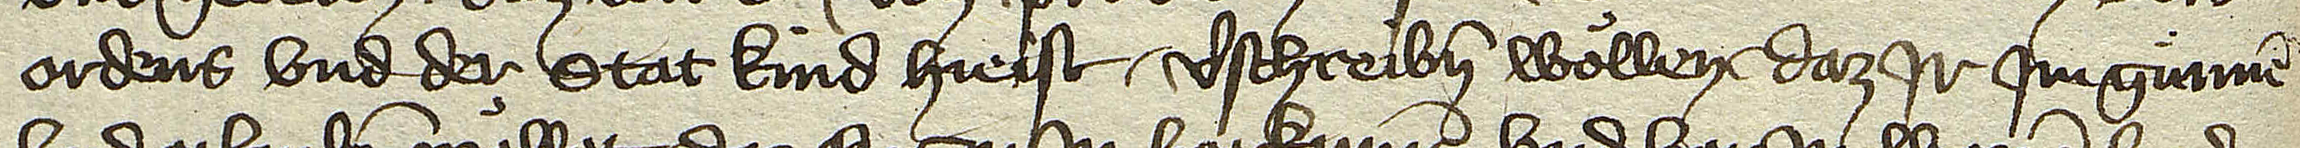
ordens vnd der Stat kind hie iſt / v*ſchreibn* wöllen / daʒ Ir Im günne*
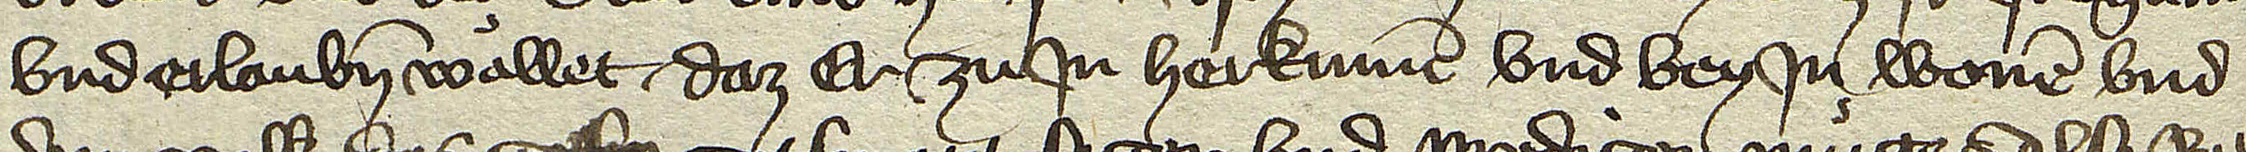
vnd erlaubn* wöllet / daʒ Er cʒu In herkume* vnd bey In wone* vnd
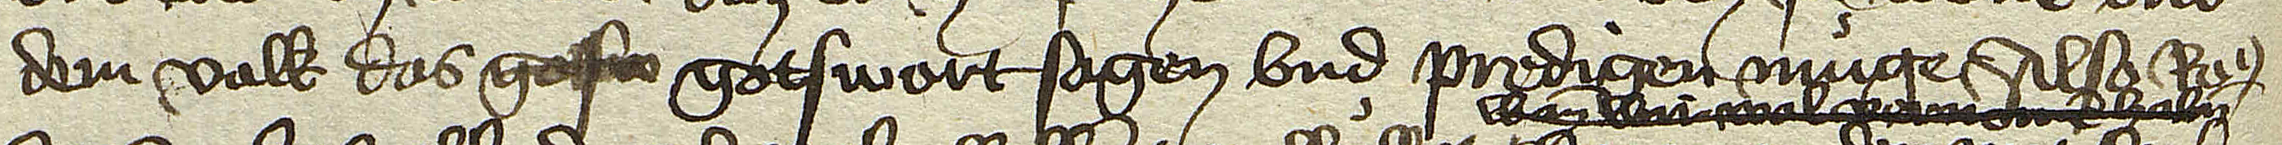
dem volk das goſw gotſwort ſagen vnd predigen müge / Alſo / Ro*
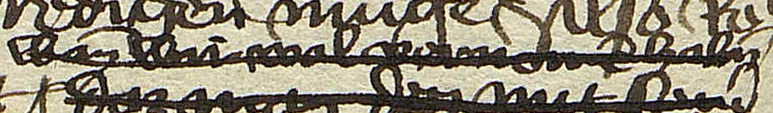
wan* wir wol vernome* habn*
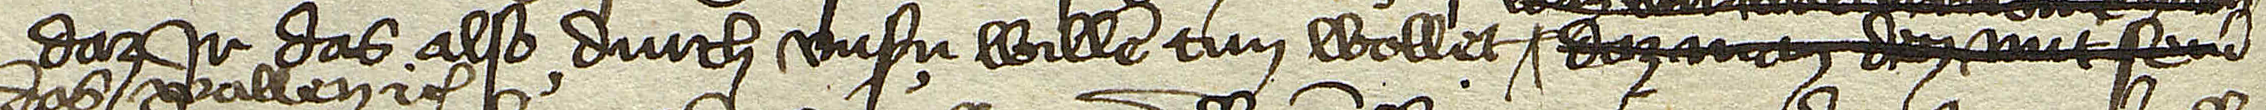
daʒ Ir das alſo durch vnſ*n wille* tun wöllet daʒ man den mit ſein*
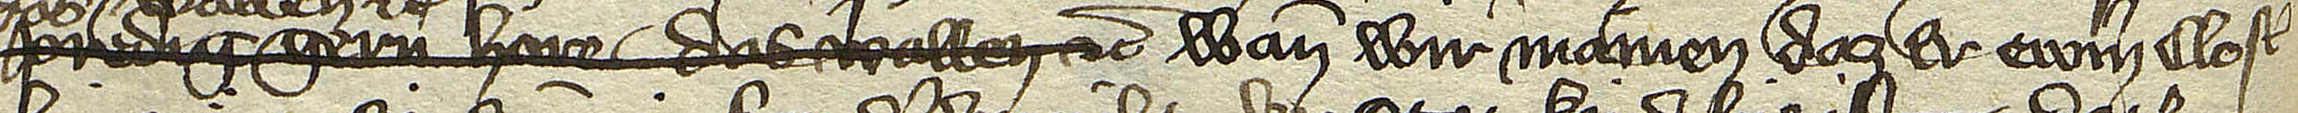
predig gern höre / das wöllen ec* wan* wir mainen daʒ Er ewm* Cloſt*
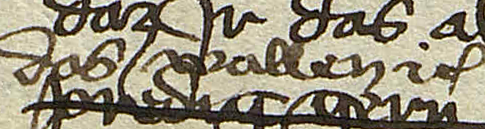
das wollen ec*
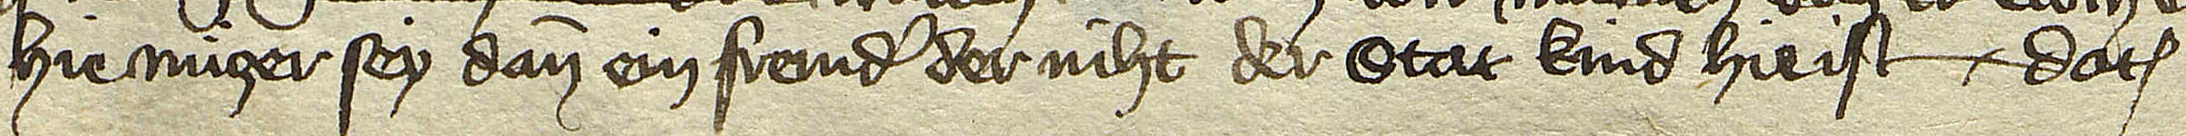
hie nücʒer ſey dan* ein fremd* der niht der Stat kind hie iſt / dat*
